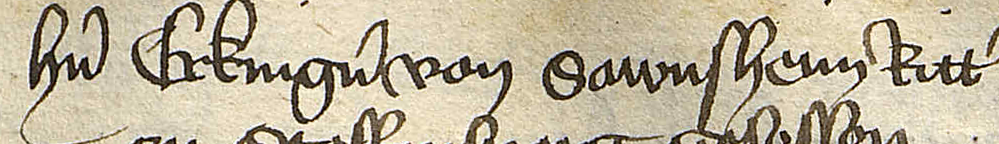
hn* Erkingn* von Sawnſheim Ritt*
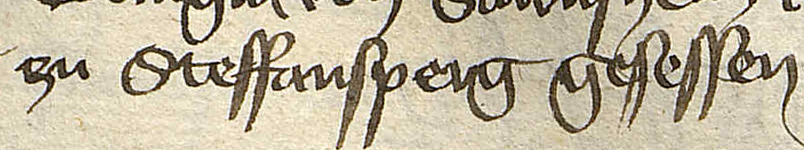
cʒu Steffanſperg geſeſſen
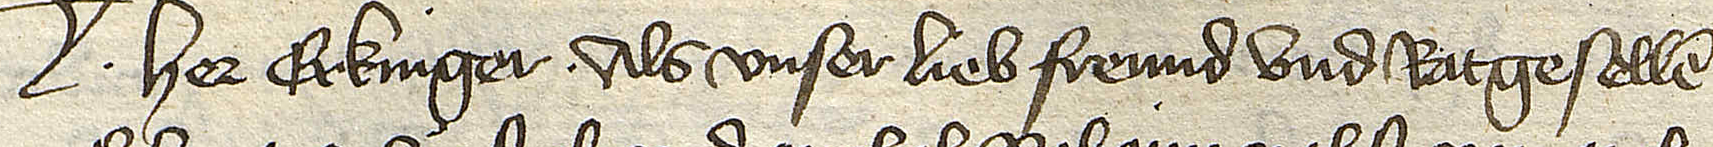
L* her Erkinger . Als vnſer lieb freund vnd Ratgeſelle*
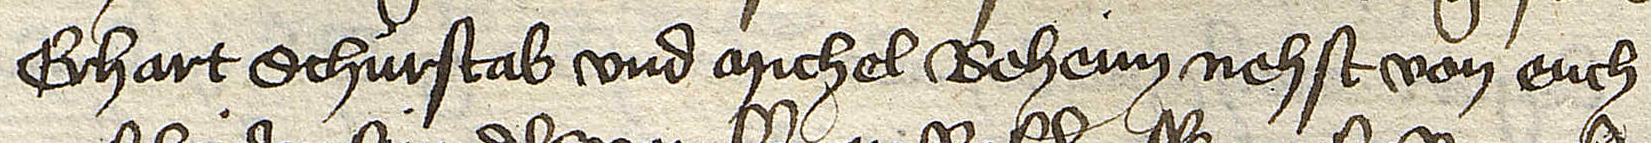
Erhart Schürſtab vnd Michel Beheim nehſt von euch
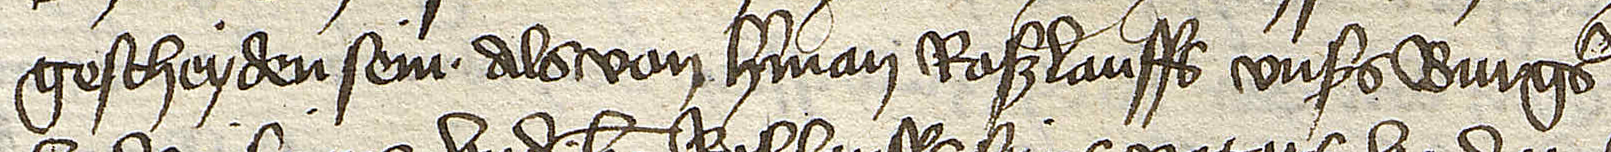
geſcheyden ſein . Als von h*man Roſʒlauffs vnſ*s Burg*s
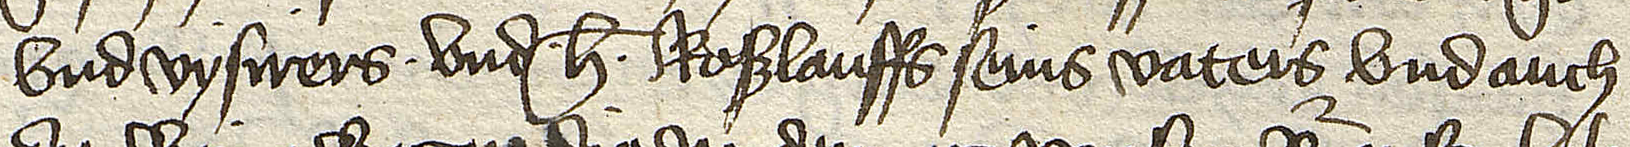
vnd vyſirers . vnd h* Roſʒlauffs ſeins vaters vnd auch
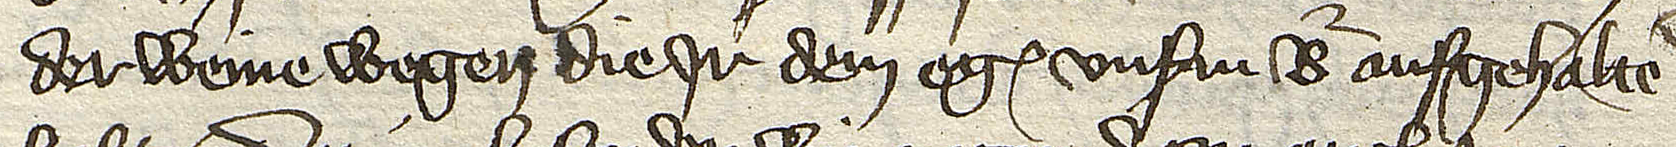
der weine wegen die Ir dem eg* vnſ*m B* aufgehalte*
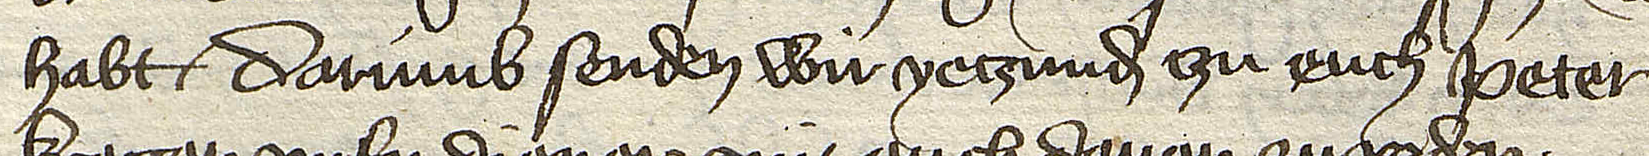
habt / Darümb ſenden wir yecʒund* cʒu euch Peter
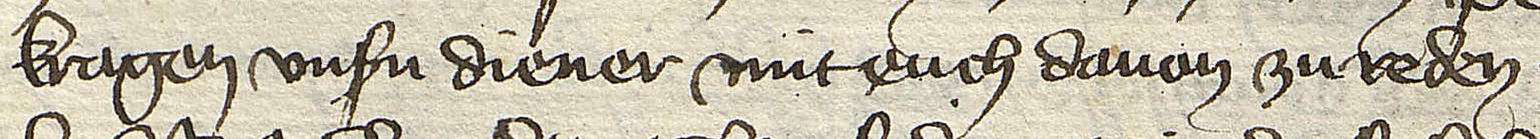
kragen vnſ*n diener mit euch dauon cʒu reden
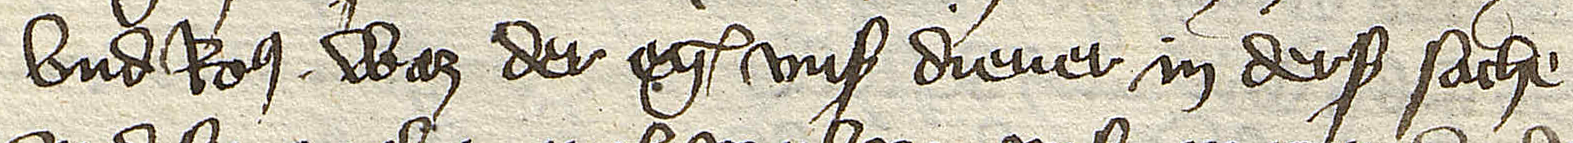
vnd Ro* . waʒ der eg* vnſ* diener in derſ* ſache
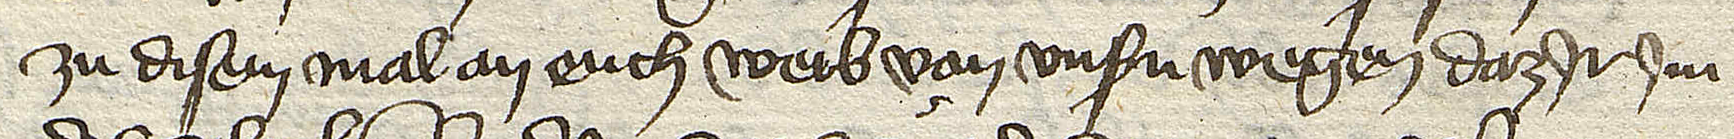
cʒu diſem mal an euch werb von vnſ*n wegen daʒ Ir Im
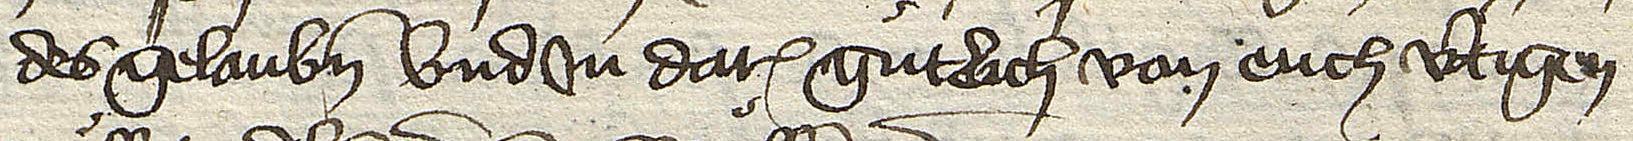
des gelaubn* vnd In dar* gütlich von euch v*tigen
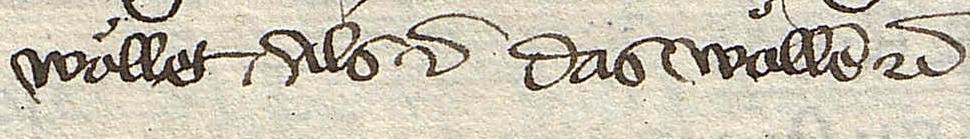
wöllet / Als ec* Das wölle* ec*
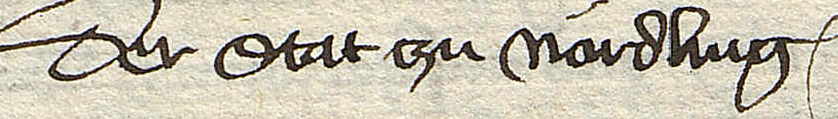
Der Stat cʒu Nördling*
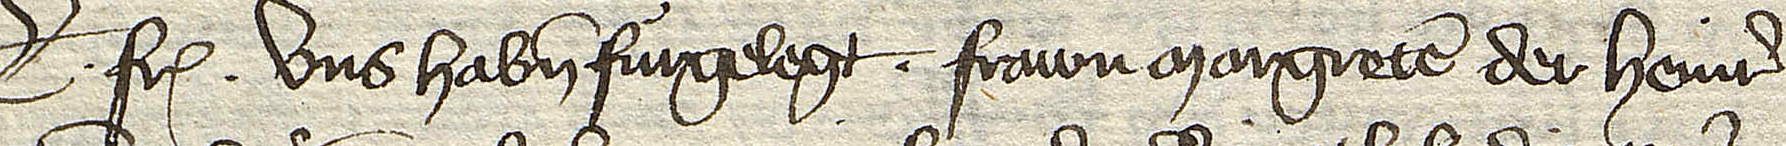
L* . fr* . Vns habn* fürgelegt . frawn Margrete* der heinr*
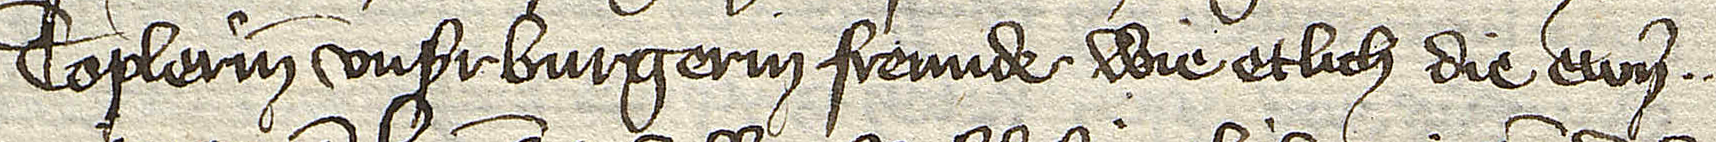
Toplerin* vnſ*r burgerin freunde wie etlich die ew*n ~
